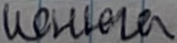конюга
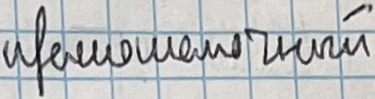красношапочный
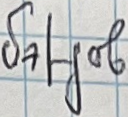бэрдов
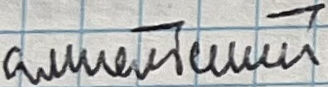алтайский
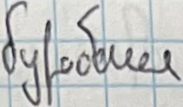буробокая
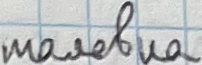таловка
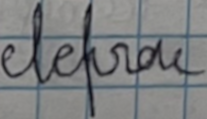сверчок
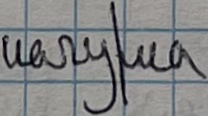качурка
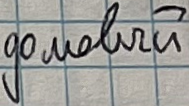домовый
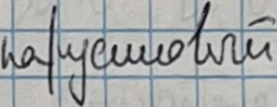парусиновый
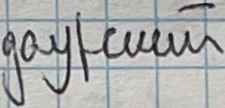даурский
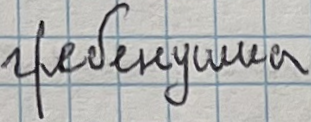гребенушка
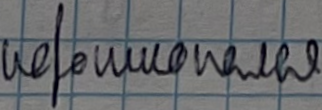короткопалая
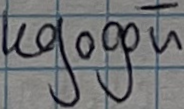козодой
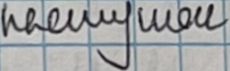пастушок
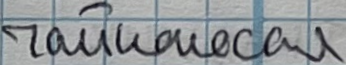чайконосая
